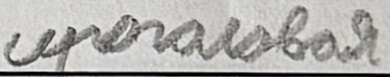сероголовая
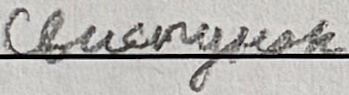свистунок
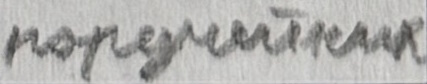поручейник
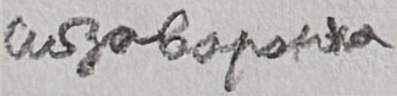сизоворонка
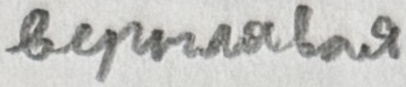вертлявая
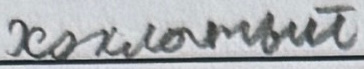хохлатый
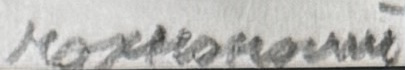мохноногий
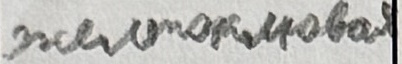желтоклювая
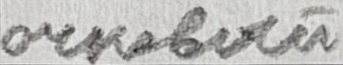очковый
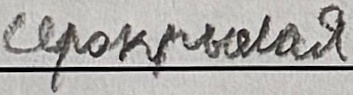серокрылая
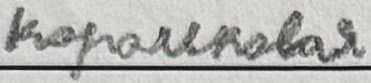корольковая
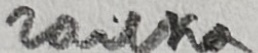галка
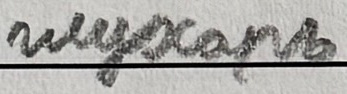глухарь
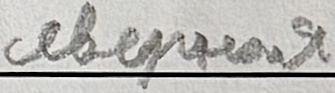северная
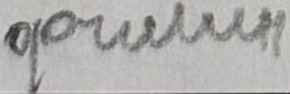филин
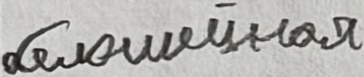белошейная
